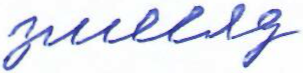змееяд
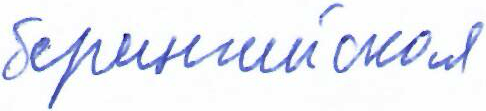берингийская
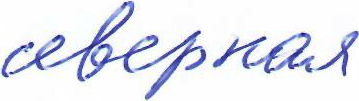северная
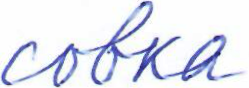совка
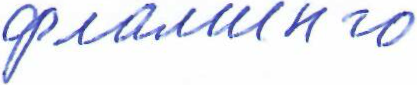фламинго
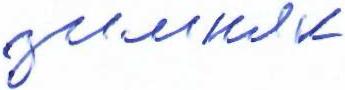зимняк
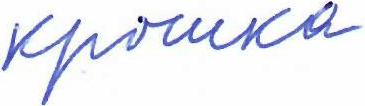крошка
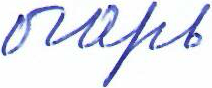огарь
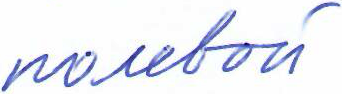полевой
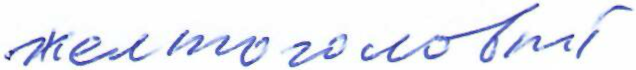желтоголовый
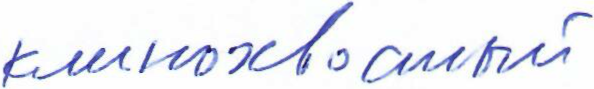клинохвостый
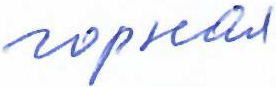горная
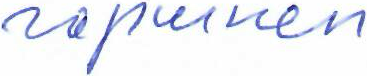гаршнеп
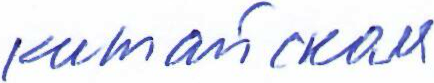китай ская
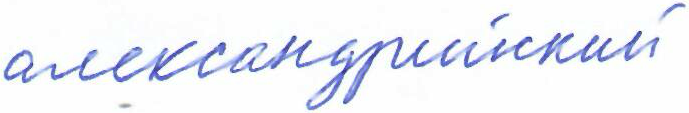александрийский
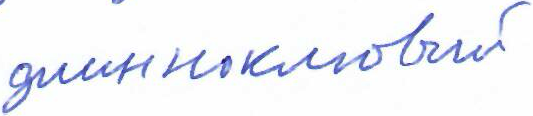длинноклювый
